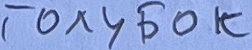голубок
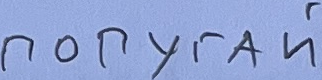попугай
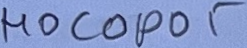носорог
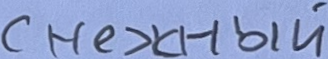снежный
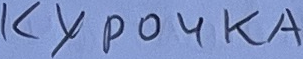курочка
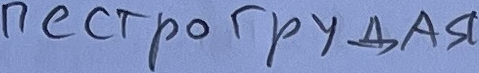пестрогрудая
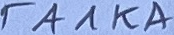галка
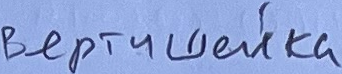вертишейка
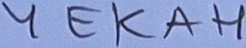чекан
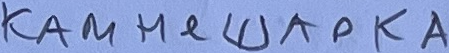камнешарка
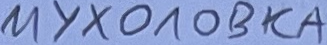мухоловка
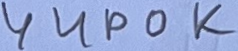чирок
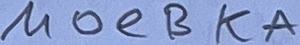моевка
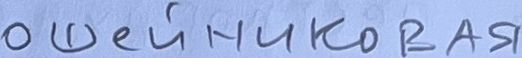ошейниковая
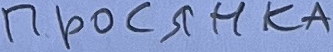просянка
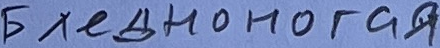бледноногая
